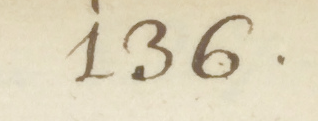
136.
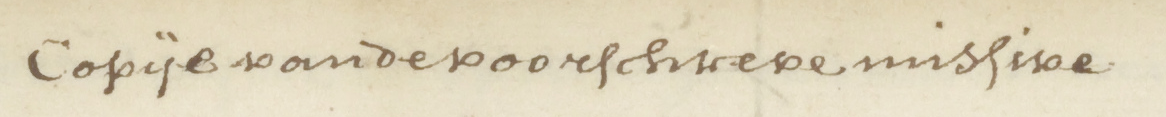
Copije vande voorschreve missive
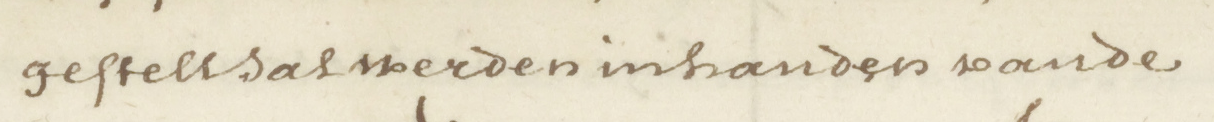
gestelt sal werden in handen vande
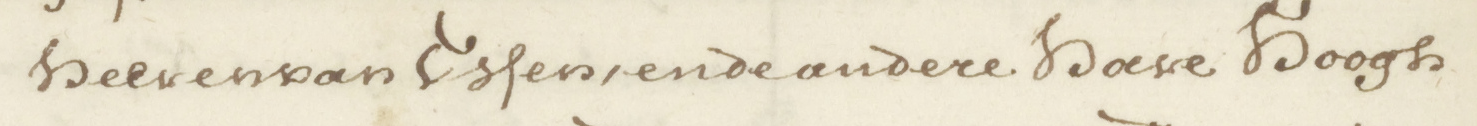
heeren van Essen, ende andere hare Hoogh
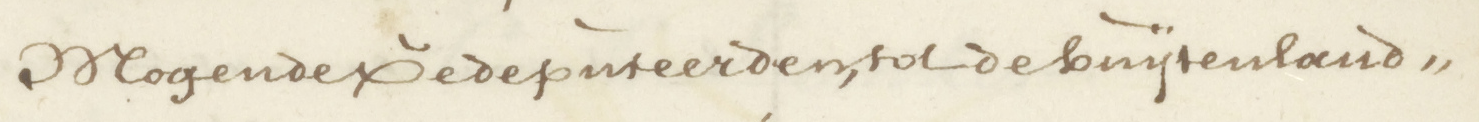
Mogende Gedeputeerden, tot de buijtenland,
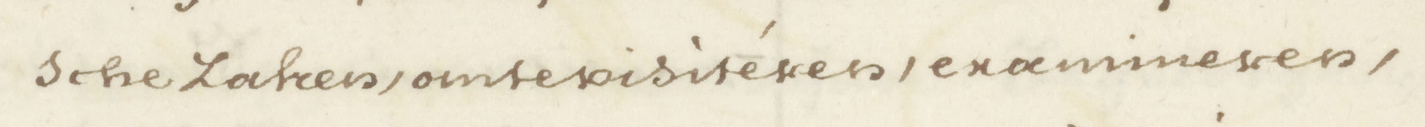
sche zaken, om te visiteren, examineren,
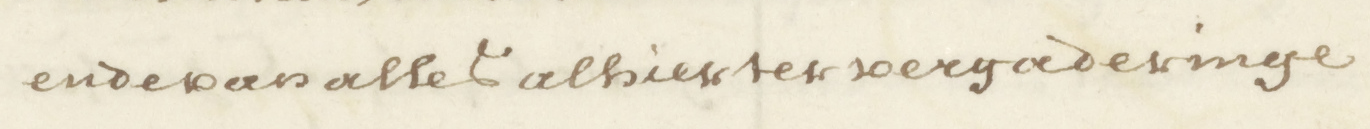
ende van alles alhier ter vergaderinge
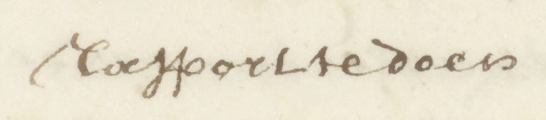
rapport te doen
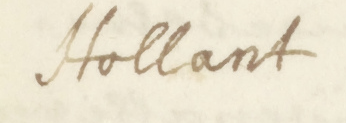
Hollant
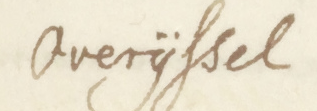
Overijssel
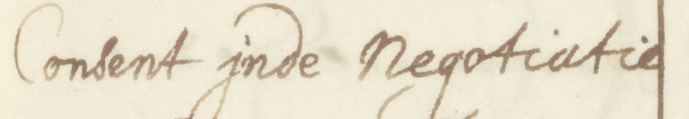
Consent inde negotiatie
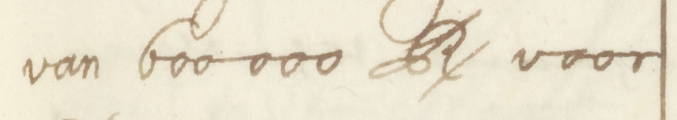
van 600000 R voor
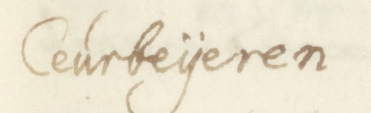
Ceurbeijeren
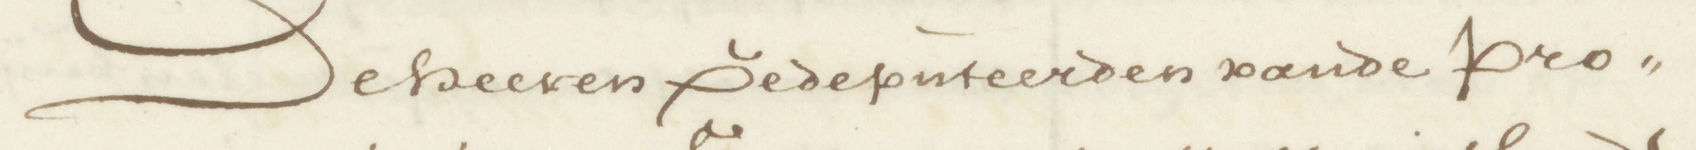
De heeren Gedeputeerden vande pro„
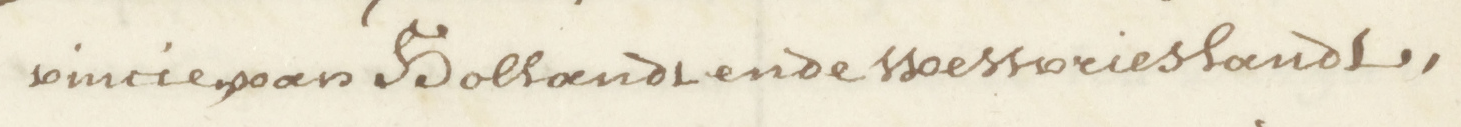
vincie van Hollandt ende Westvrieslandt,
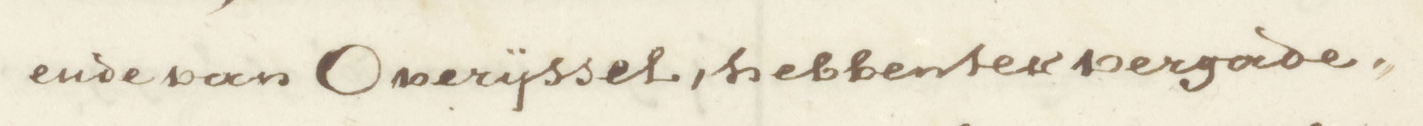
ende van Overijssel, hebben ter vergade„
